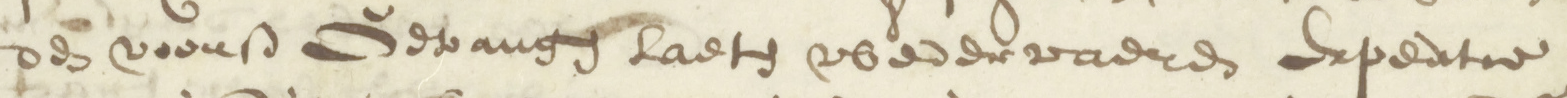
den voors Gevangen laeten wedervaeren Expeditie
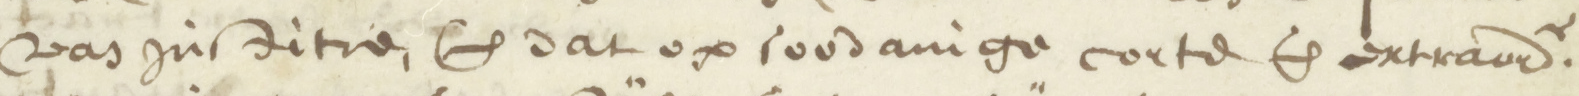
van justitie & dat op soodanige corte & extraords.
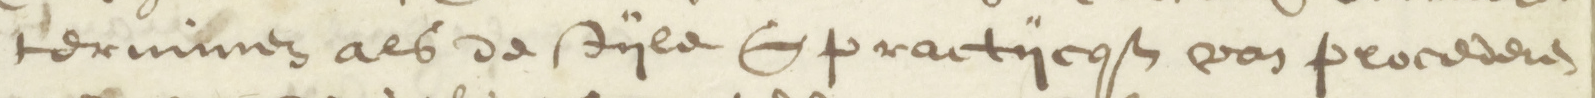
terminen als de stijle & practijcqe van procederen
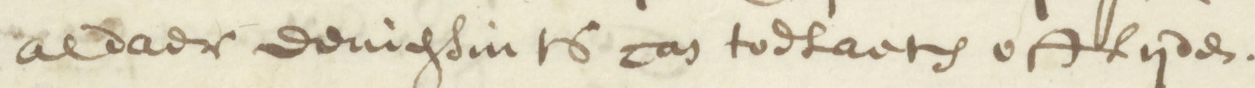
aldaer eenichsints can toelaeten off lyden
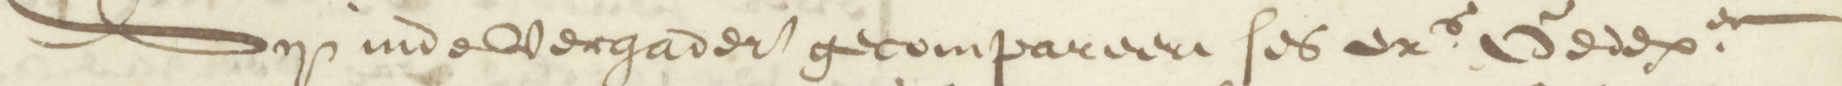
Syn inde Vergader gecompareert ses exs. Gedepen.
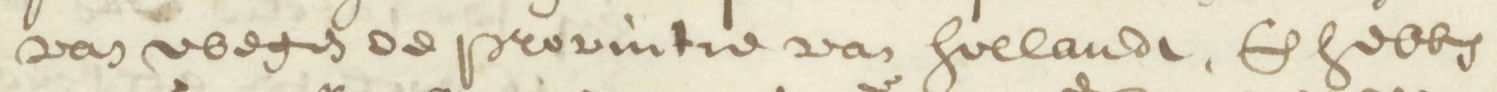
van wegen de provintie van hollandt, & hebben
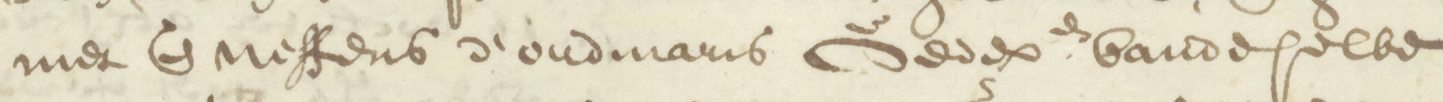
met & neffens d'ordinaris Gedepen. van deselve
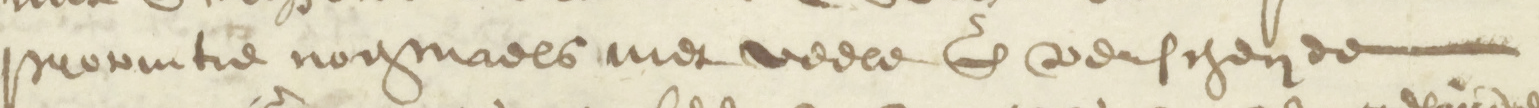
provintie nochmaels met veele & verscheyde
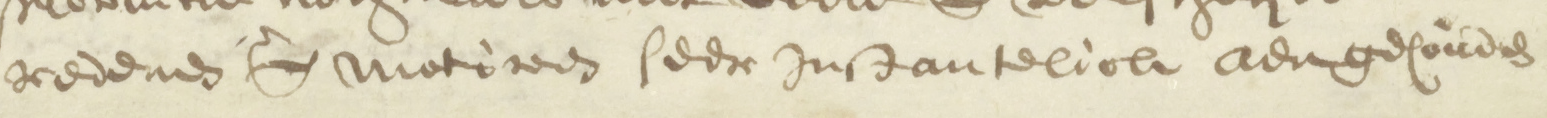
redenen & motiven seer instantelick aengehouden
